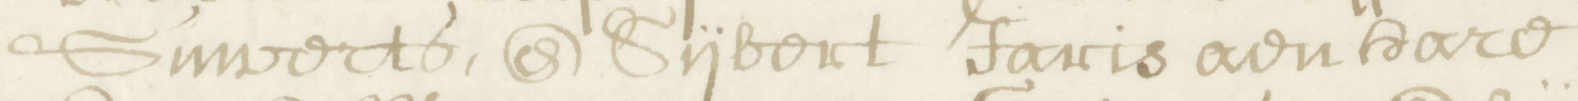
Suwerts, & Sijbert Jaris aen hare
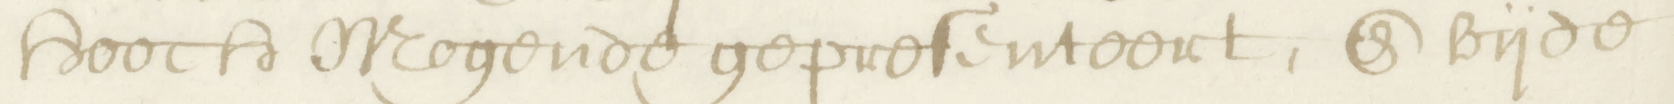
Hooch Mogende gepresenteert, & bijde
